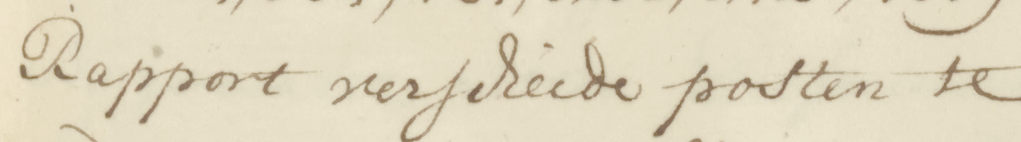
Rapport verscheide posten te
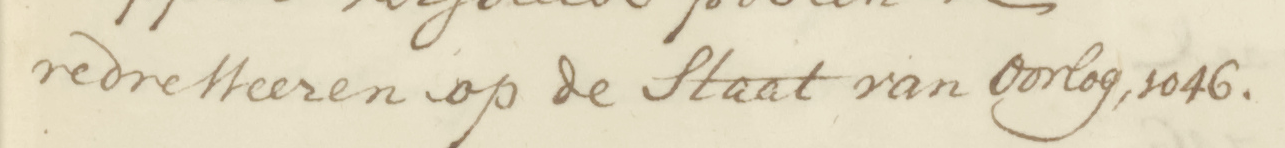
redresseeren op de Staat van oorlog, 1046.
